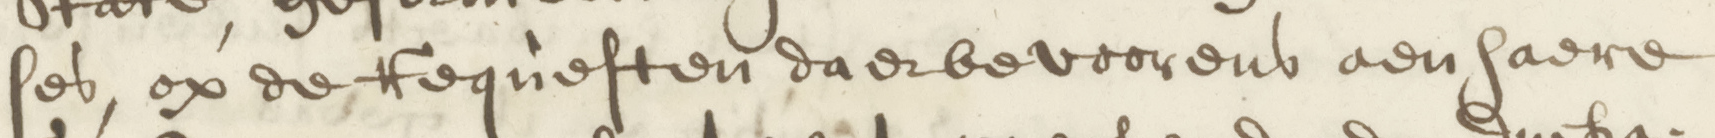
ses op de Requesten daerbevoorens aen haere
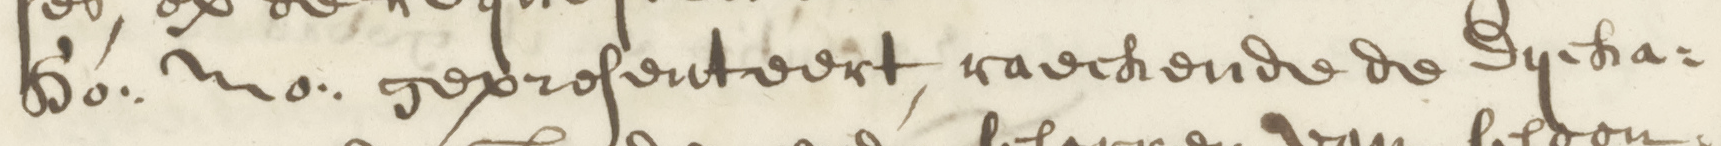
Ho:Mo: gepresenteert, raeckende de Dycka=
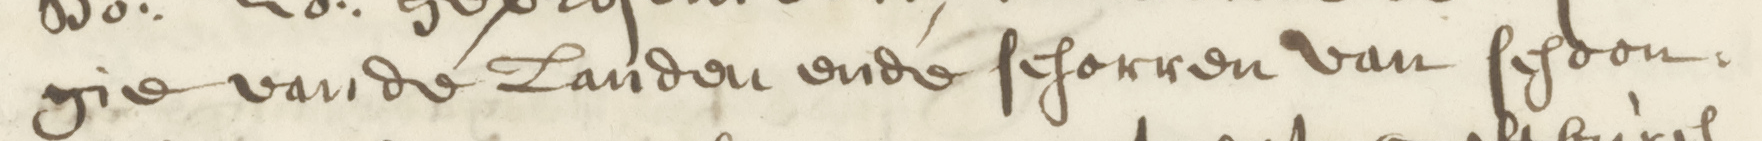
gie van de Landen ende schorren van schoon„
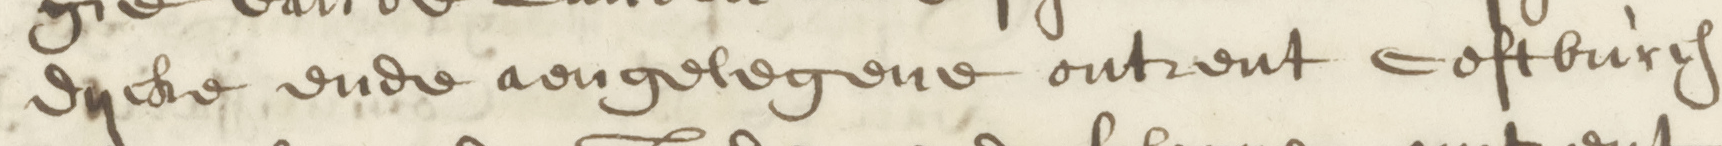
dycke ende aengelegene ontrent Oostburch,
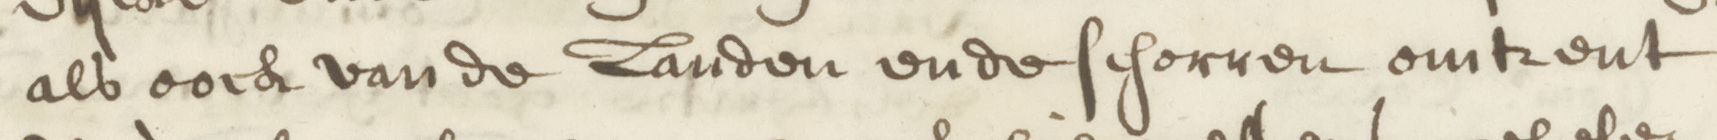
als oock van de Landen ende schorren omtrent
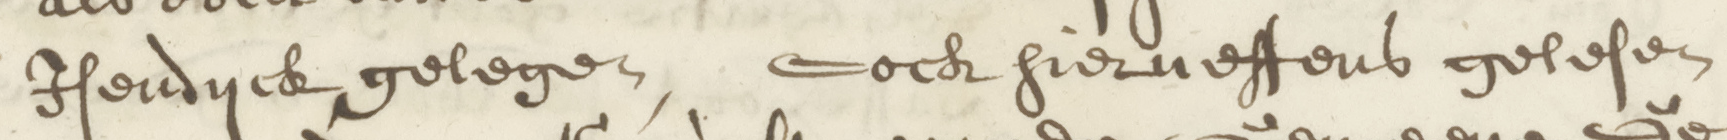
Isendyck gelegen, Oock hierneffens gelesen
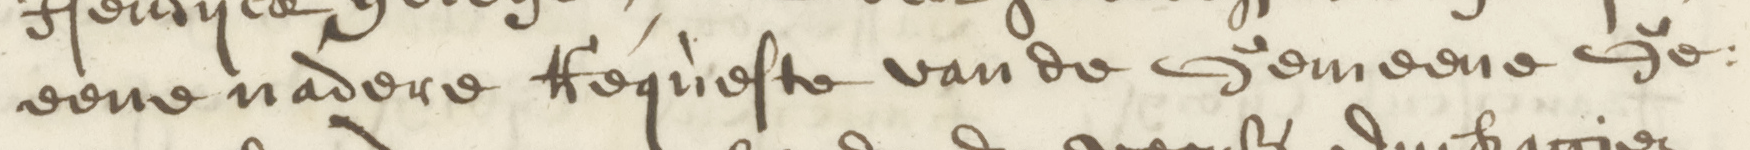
eene nadere Requeste van de Gemeene Ge„
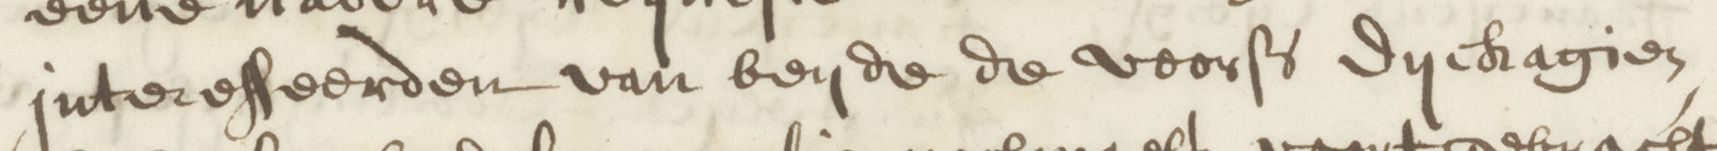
interesseerden van beyde de voors Dyckagien,
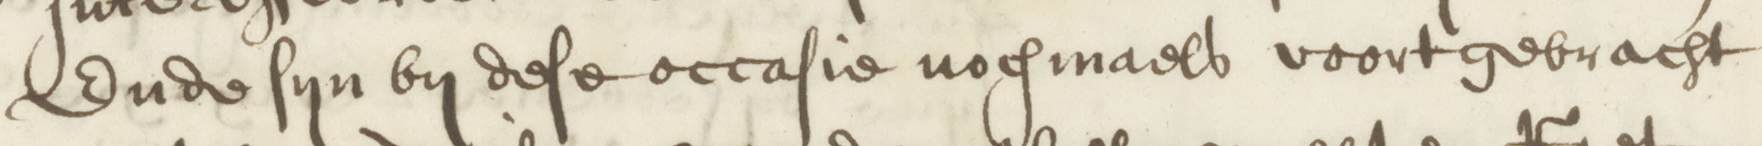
Ende syn by dese occasie nochmaels voortgebracht
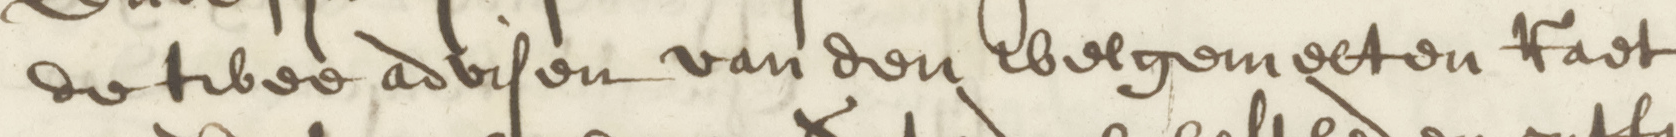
de twee advisen van den welgemelten Raet
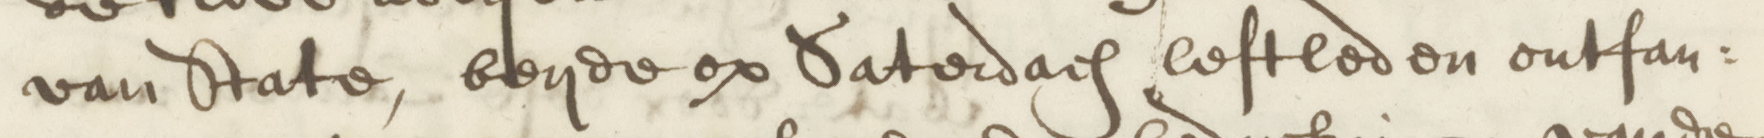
van State, beyde op Saterdach lestleden ontfan=
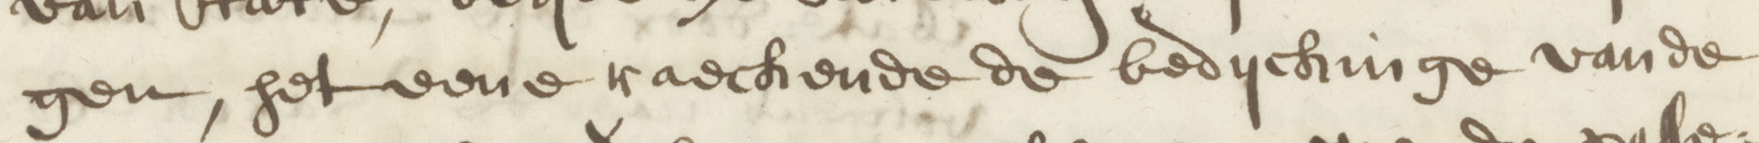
gen, het eene raeckende de bedyckinge vande
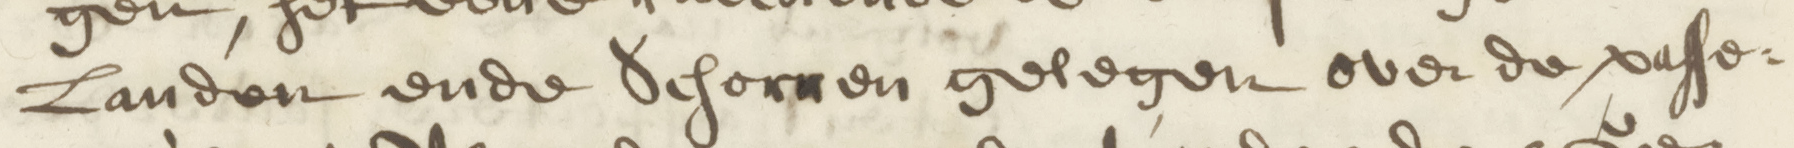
Landen ende Schorren gelegen over de passe=
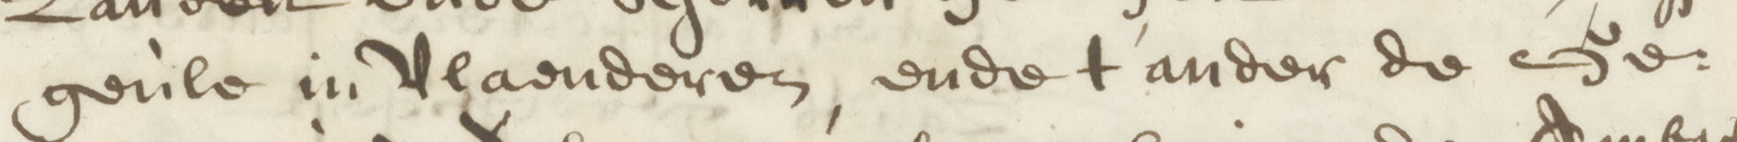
geule in Vlaenderen, ende t'ander de Ge=
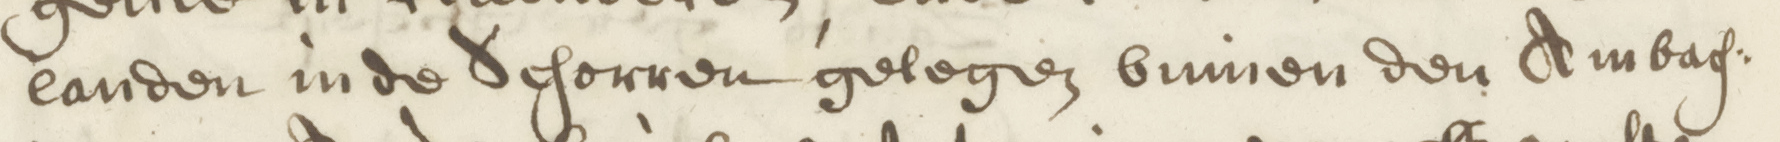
landen in de Schorren gelegen binnen den Ambach„
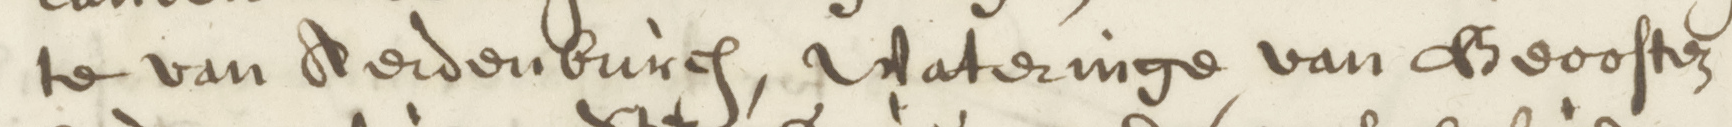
te van Aerdenburch, Wateringe van Beoosten
